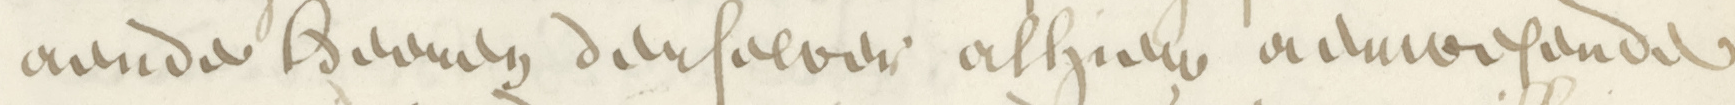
aende Heeren derselver alhier aenwesende
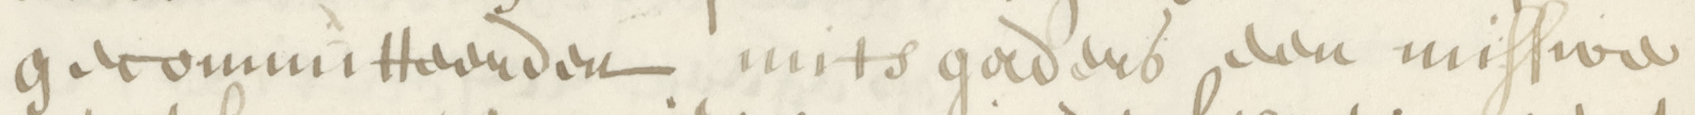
gecommitteerden mitsgaders een missive
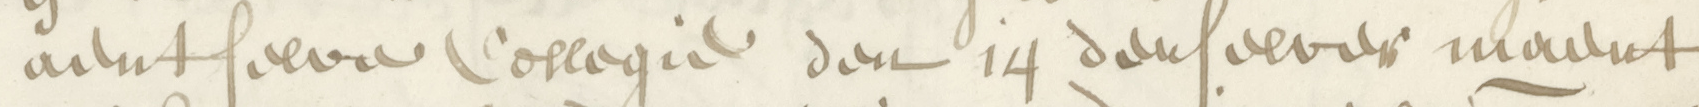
aent selve Collegie den 14 derselver maent
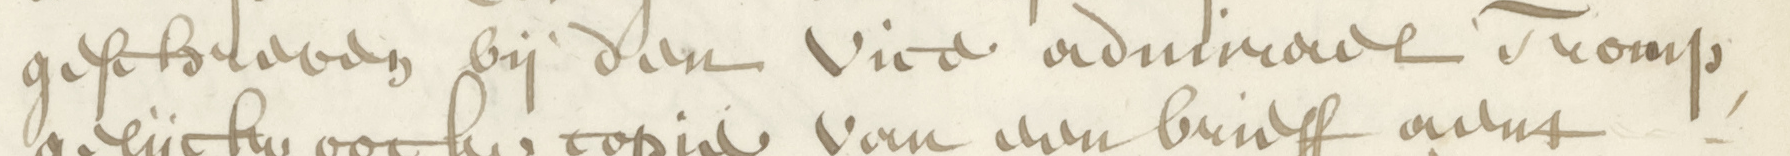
geschreven bij den Vice admirael Tromp,
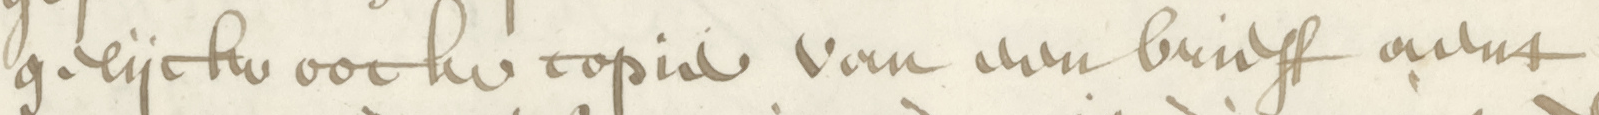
gelijck oock copie van een brieff aent
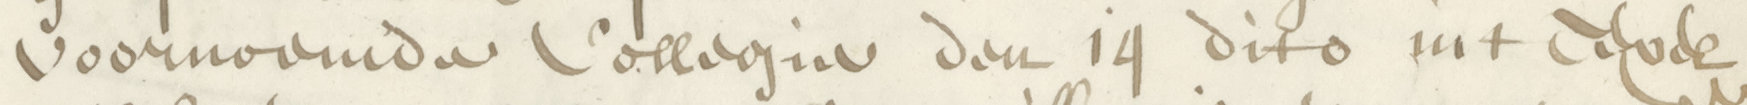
voornoemde Collegie den 14 dito int Texel
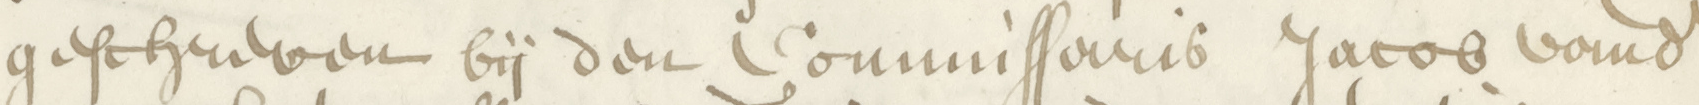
geschreven bij den Commissaris Jacob vander
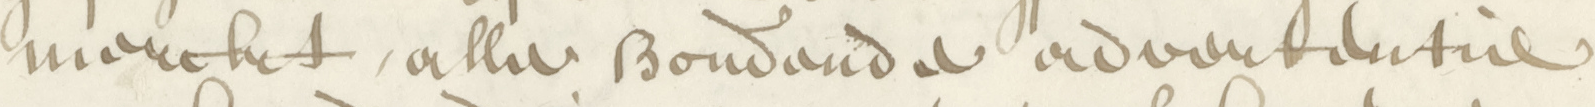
merckt, alle houdende advertentie
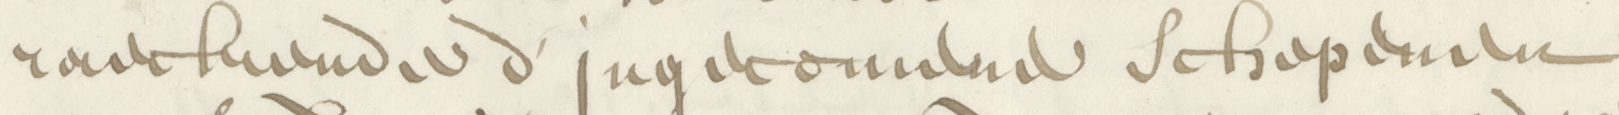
raeckende d'ingecomene schepenen
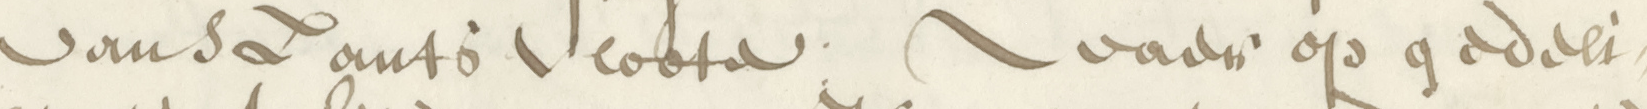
van sLants Vloote. Waer op gedeli„
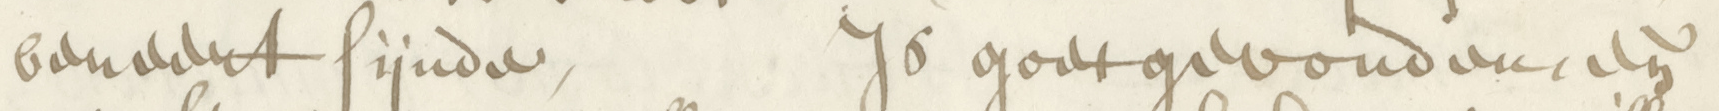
„bereert sijnde, Is goetgevonden, en
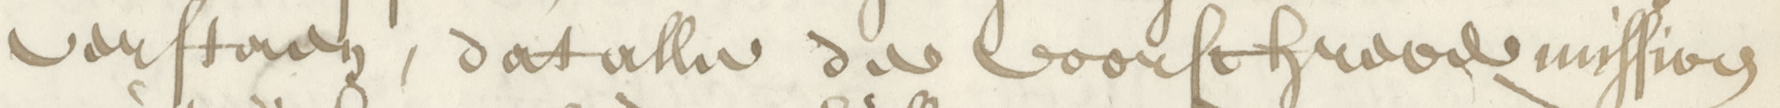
verstaen, dat alle de voorschreve missiven
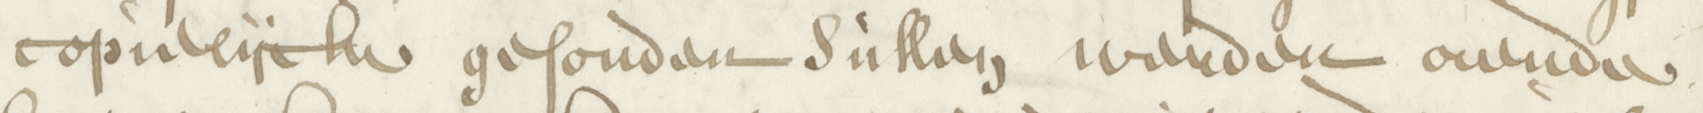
copielijck gesonden sullen werden aende
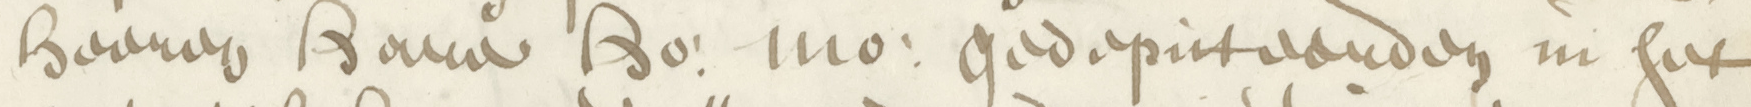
heeren hare Ho:Mo: Gedeputeerden in het
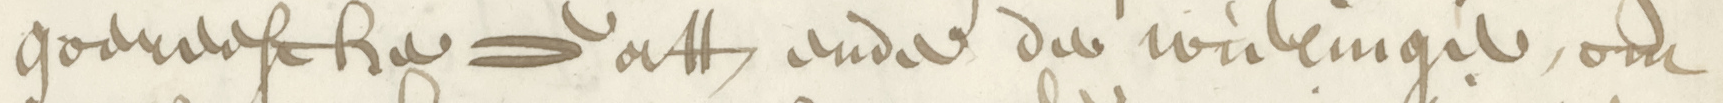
goereesche Gatt, ende de wielinge, om
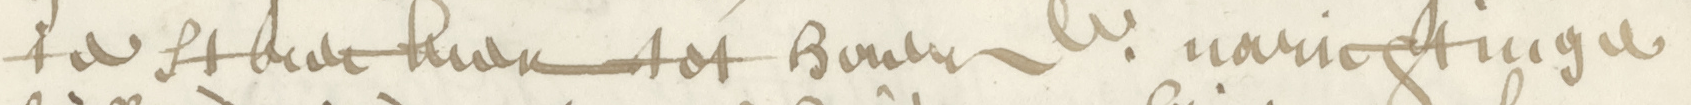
te strecken tot haer E. narichtinge
